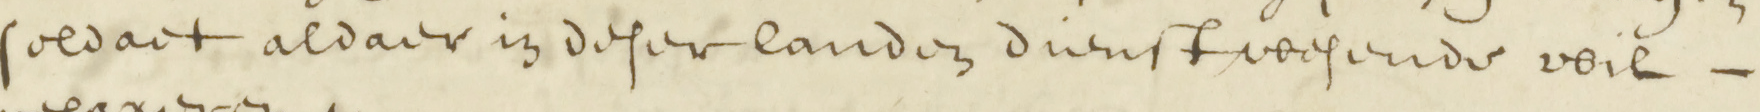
soldaet aldaer in deser landen dienstwesende wil
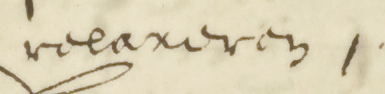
relaxeren.
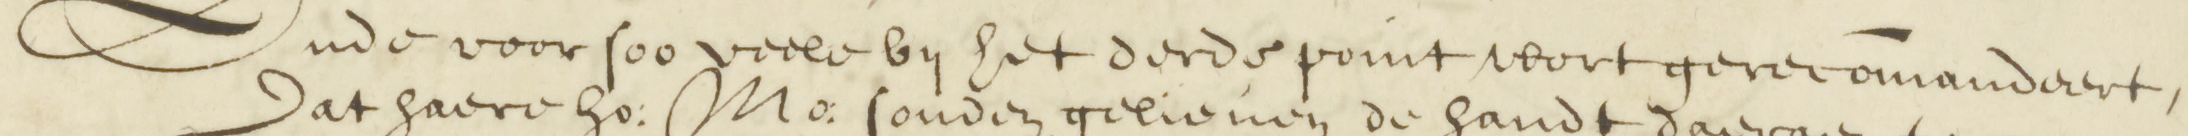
Ende voor soo veele by het derde point wort gerecomandeert,
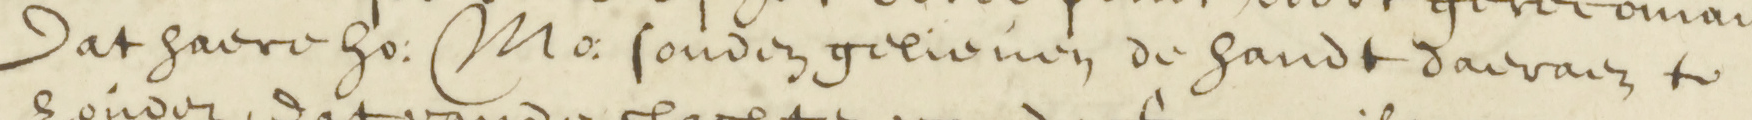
Dat haere ho:Mo: souden gelieuen de handt daeraen te
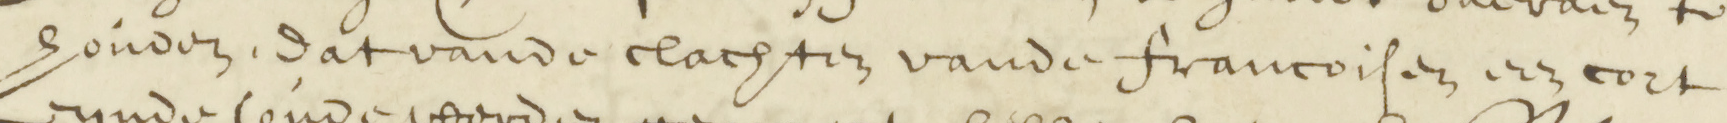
houden, dat vande clachten vande francoisen een cort
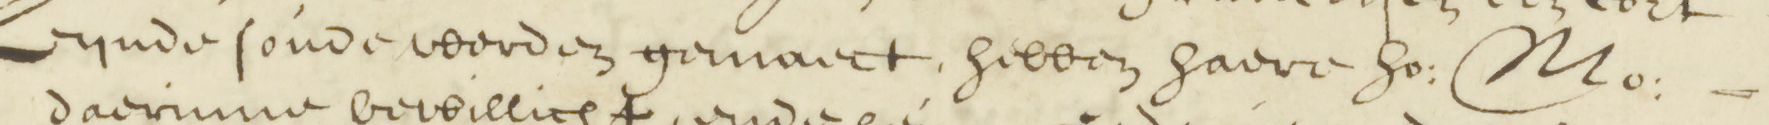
eynde soude werden gemaect, hebben haere ho:Mo: -
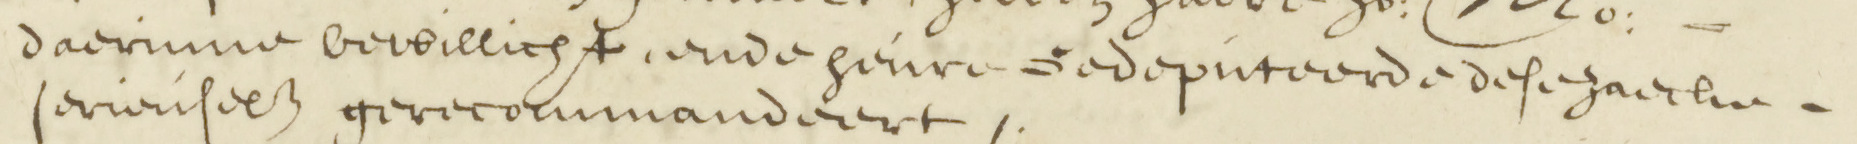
daerinne bewillicht, ende heure Gedeputeerde dese zaecke
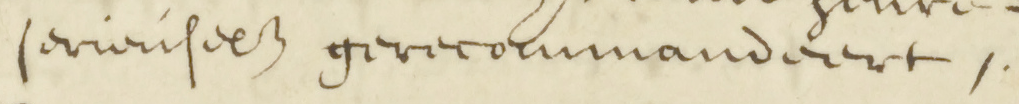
serieusel gerecommandeert.
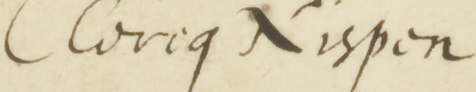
Clercq Nispen
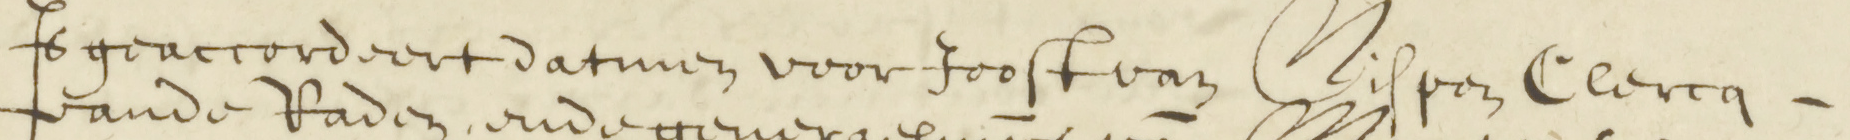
Is geaccordeert datmen voor Joost van Nispen Clercq
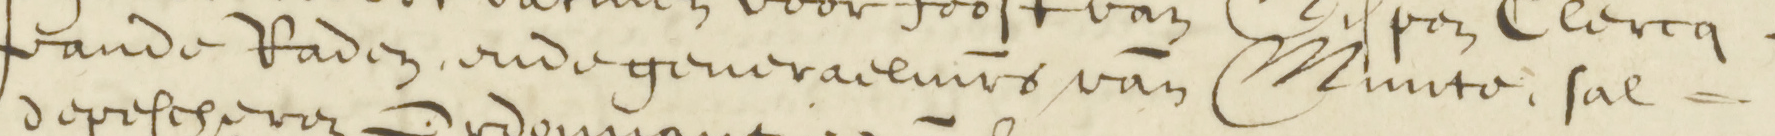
vande Raden, ende generaelmrs van Munte, sal
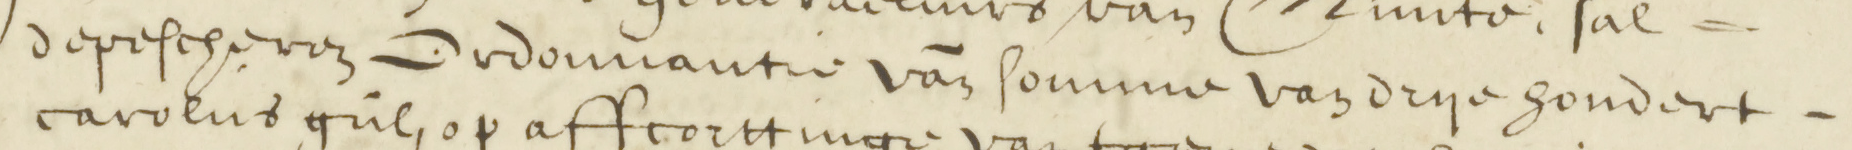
depescheren Ordonnantie van somme van drye hondert
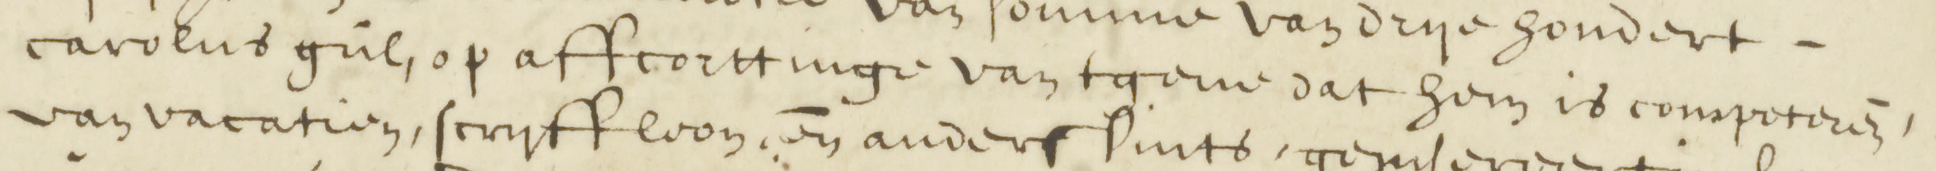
carolus gul, op affcorttinge van tgene dat hem is competeren
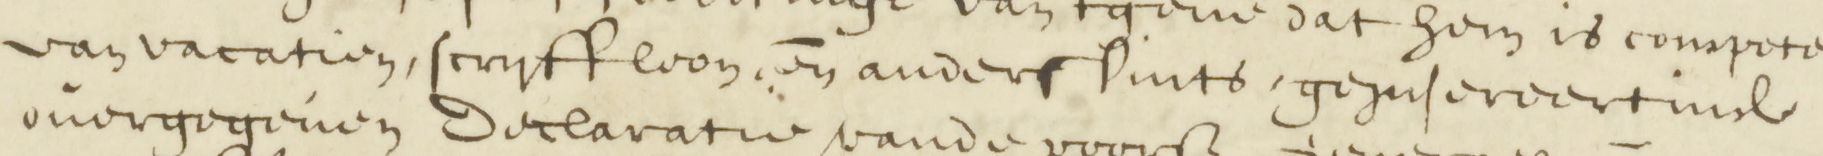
van vacatien, scryffloon, en anders sints geinsereert inde
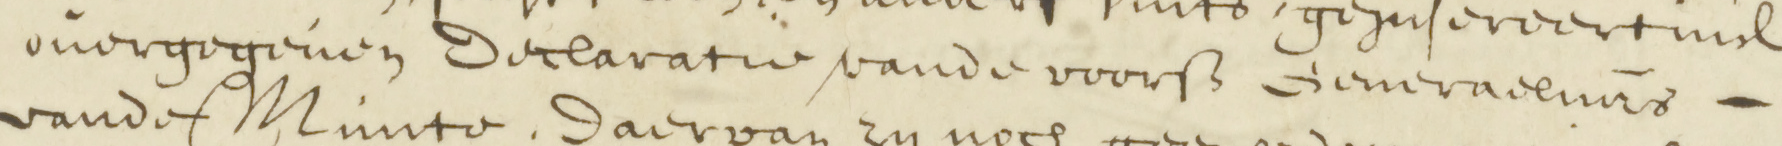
ouergegeven Declaratie vande voors Generaelmrs
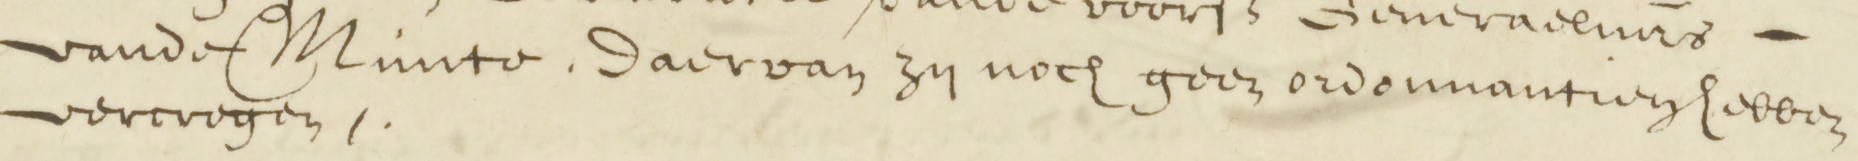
vande Munte. Daervan zy noch geen ordonnantien hebben
